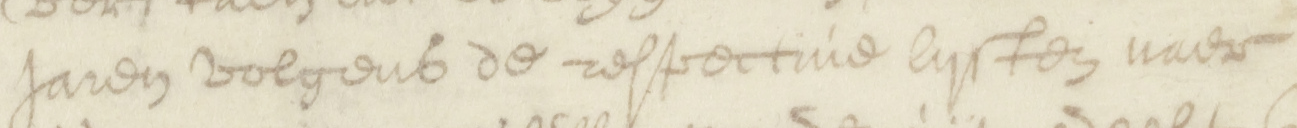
jaren volgens de respectiue lysten naer
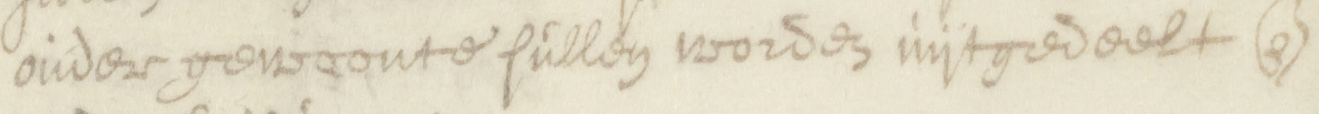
ouder gewoonte sullen worden uijtgedeelt &
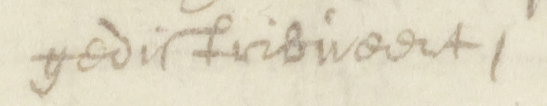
gedistribueert.
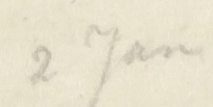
2 Jan.
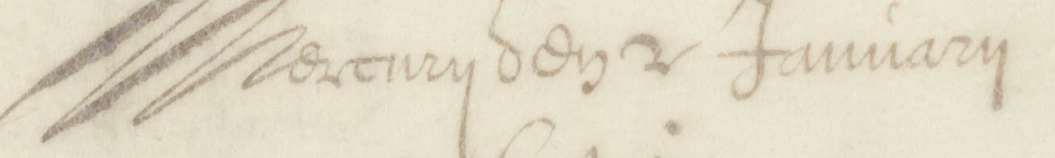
Mercury de 2 January
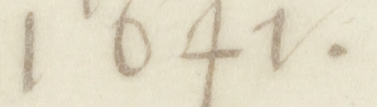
1641.
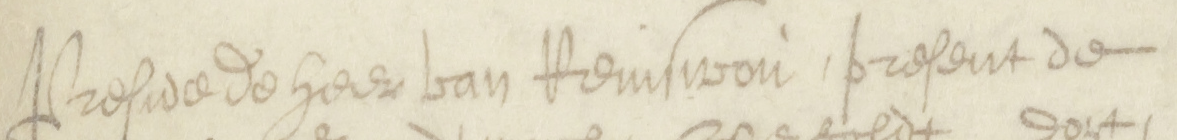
Preside de heer van Reinswou, present de
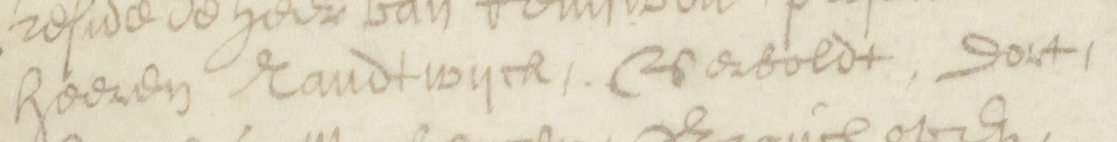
heeren Randtwyck, Verboldt, Dort,
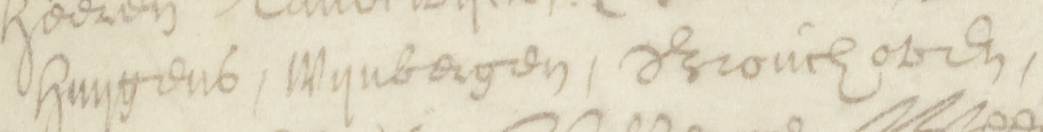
huygens, Wynbergen, Brouchoven,
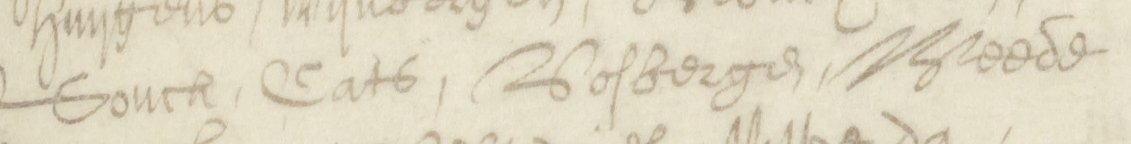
Sonck, Cats, Vosbergen, Weede
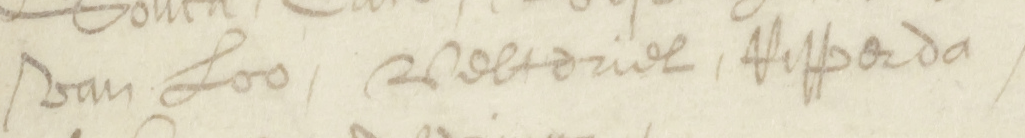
van Loo, Veltdriel, Ripperda,
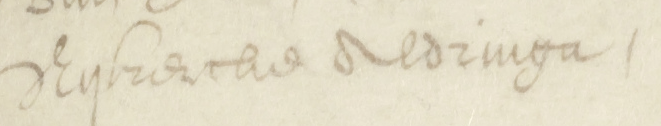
Nykercke Aldringa
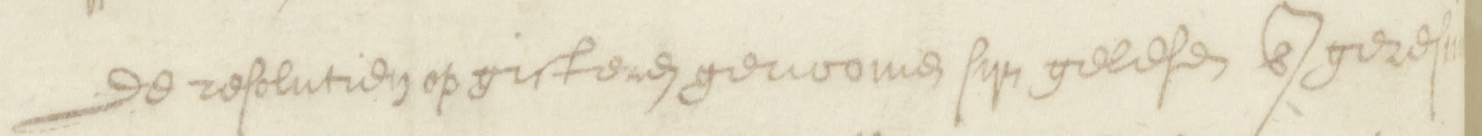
De resolutien op gisteren genoomen syn gelesen & geresu
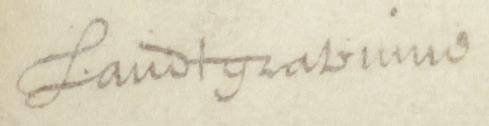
Landtgravinne
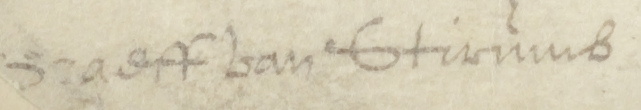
Graeff van Stirumb
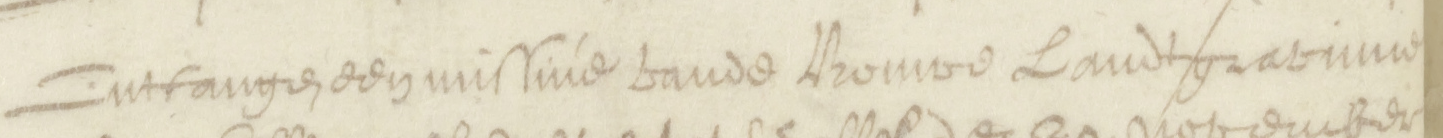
Ontfangen een missiue vande Vrouwe Landtgravinne
